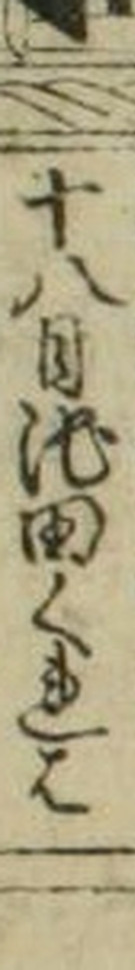十八日池田くれは
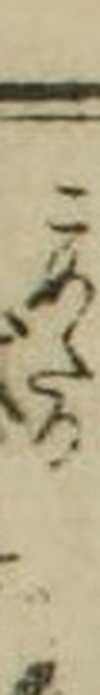こめたる
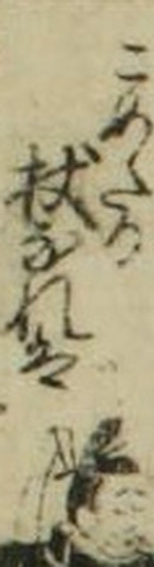杖なれは
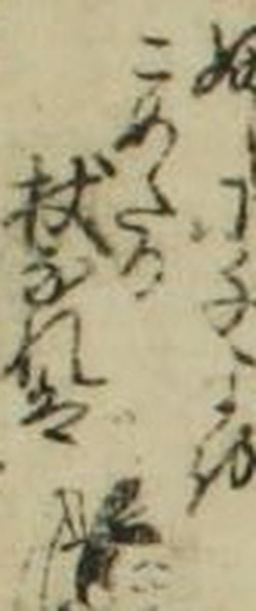杖なれは
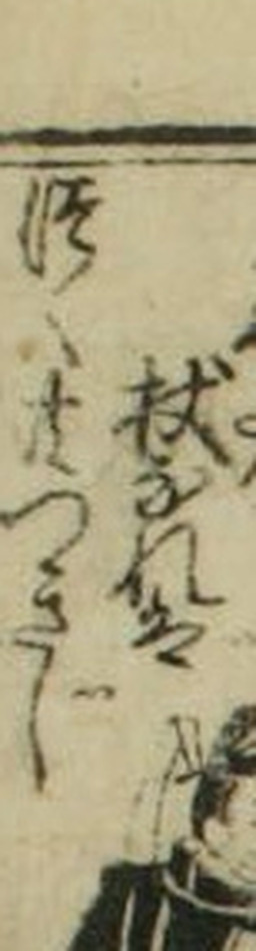つく共つきじ
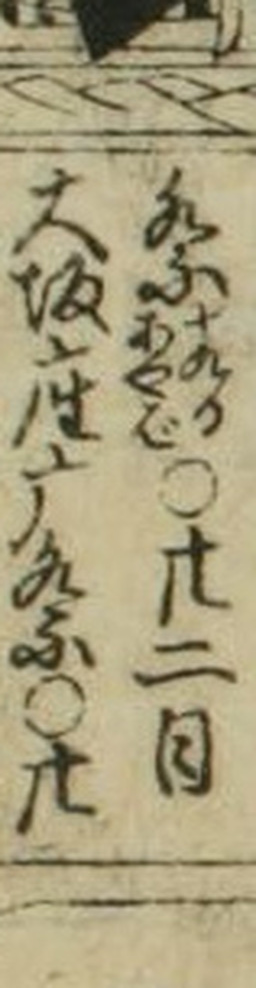大坂座摩祭○廿
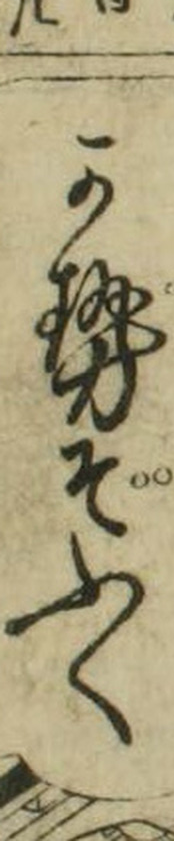かぜぞふく
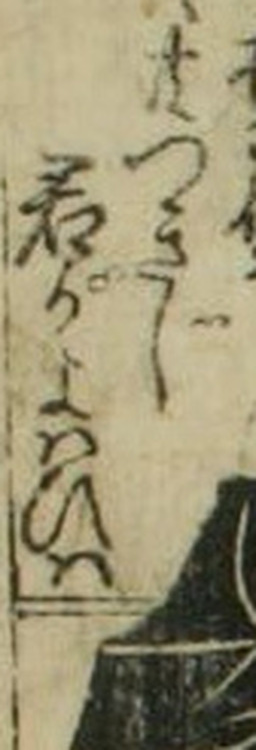君がよはひは
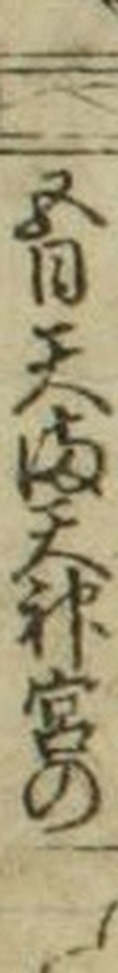五日天満天神宮の

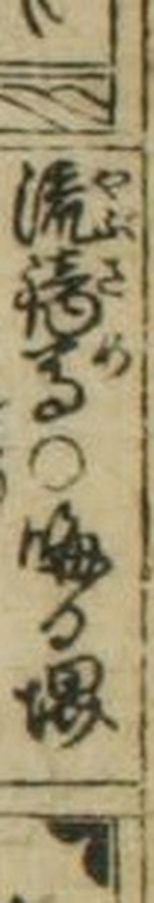流鏑馬○晦日堺
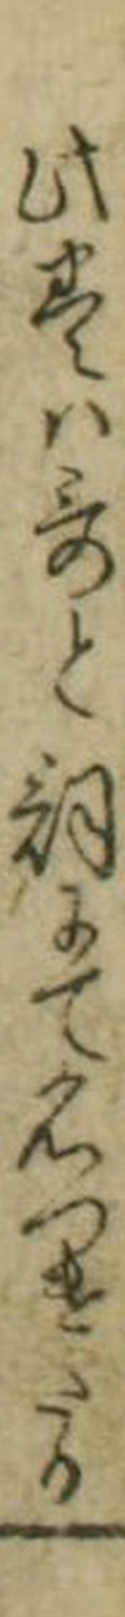此巻は哥と詞にて名つけたる
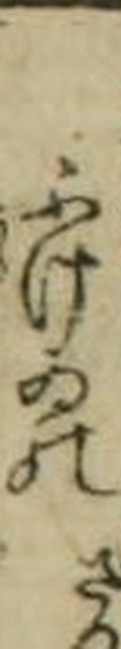ふけゐの
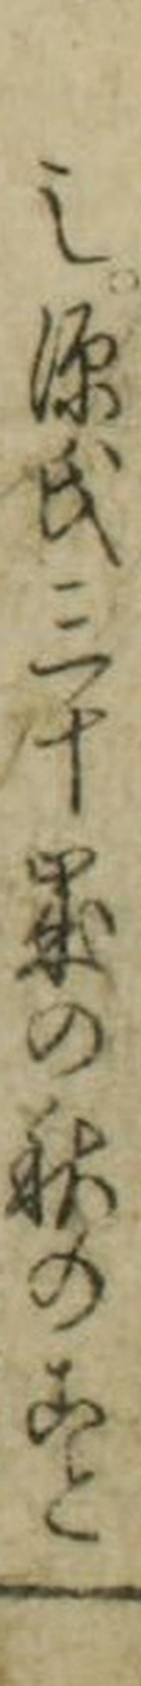也。源氏三十歳の秋のこと
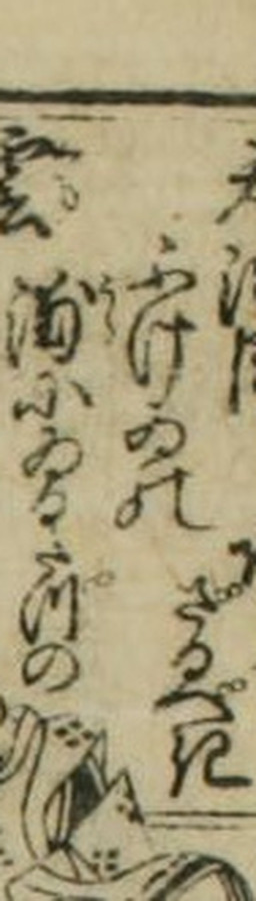浦にゐるたづの
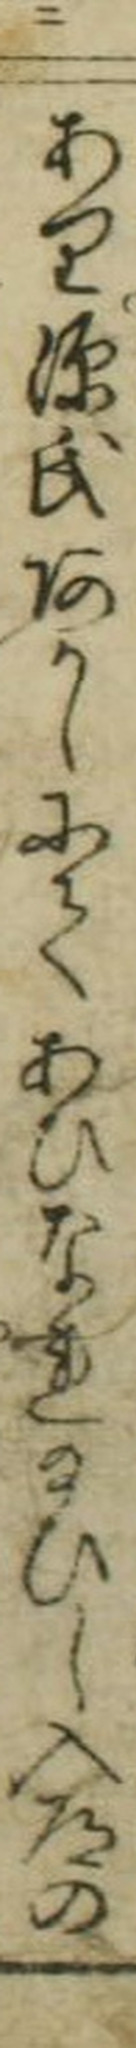あり。源氏あかしにてあひなれ給ひし入道の
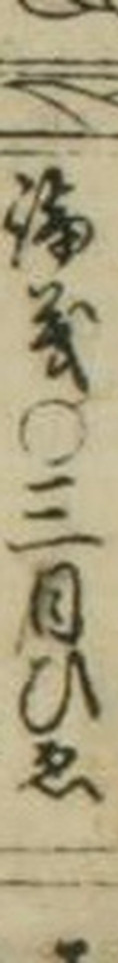論義○三日ひゑ
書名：女源氏教訓鑑
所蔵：東京学芸大学附属図書館
